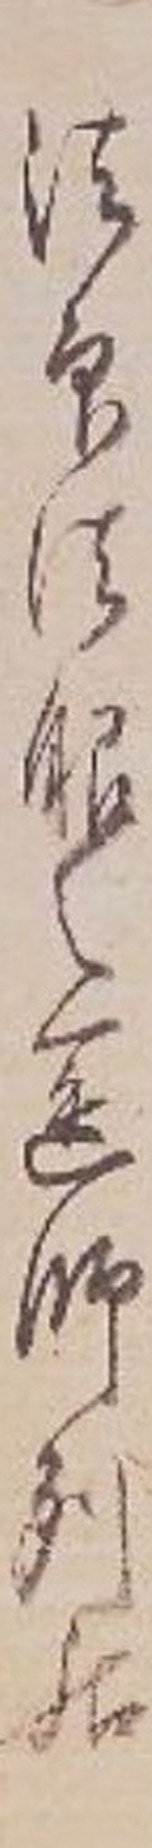法印法服之医師列居

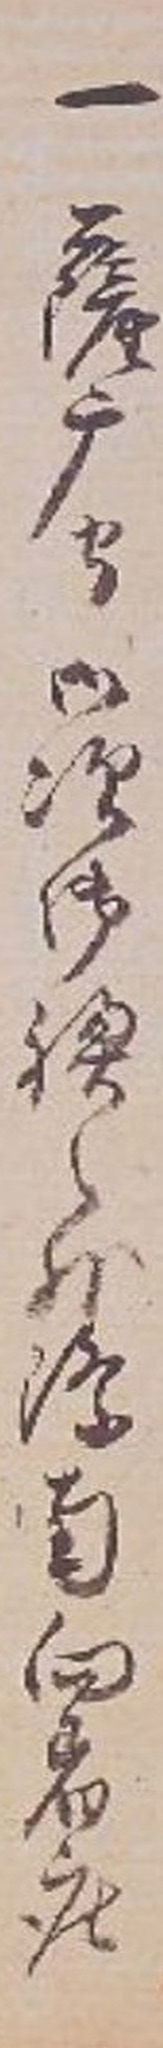一薩摩守御次御襖之外際南向着座
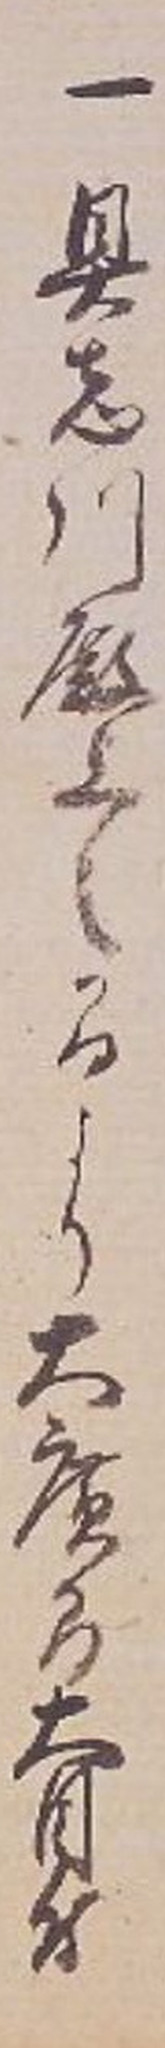一具志川殿上之間より大広間大目付
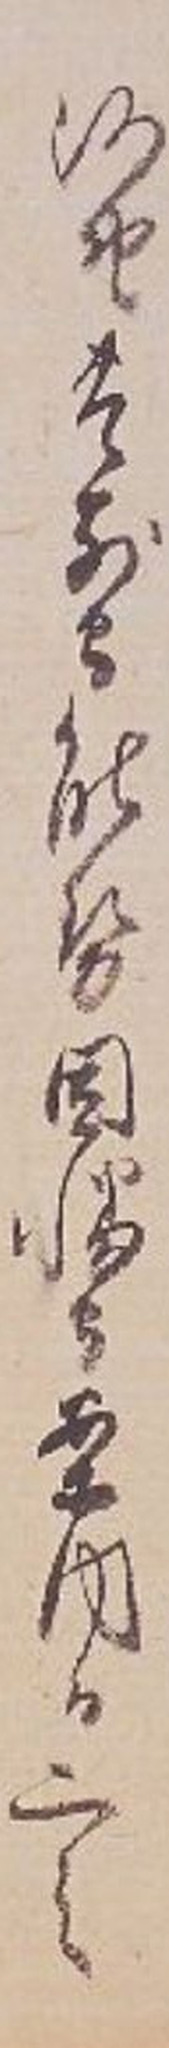河野豊前守能勢因幡守案内候二之
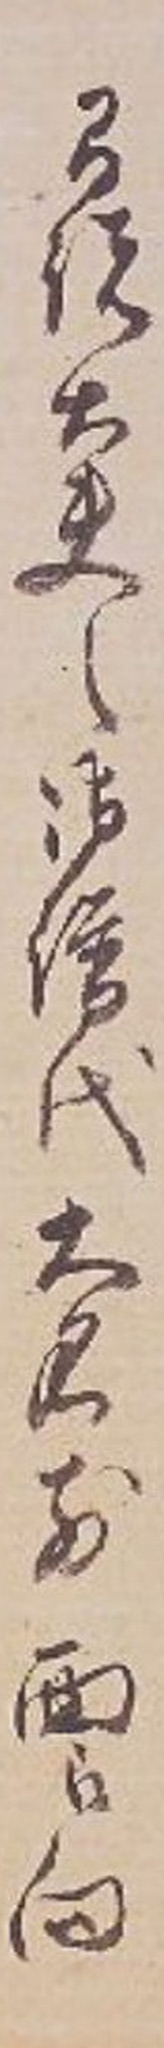間諸大夫の御譜代大名前面え向
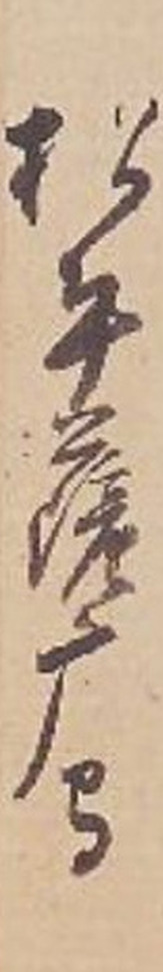松平薩摩守
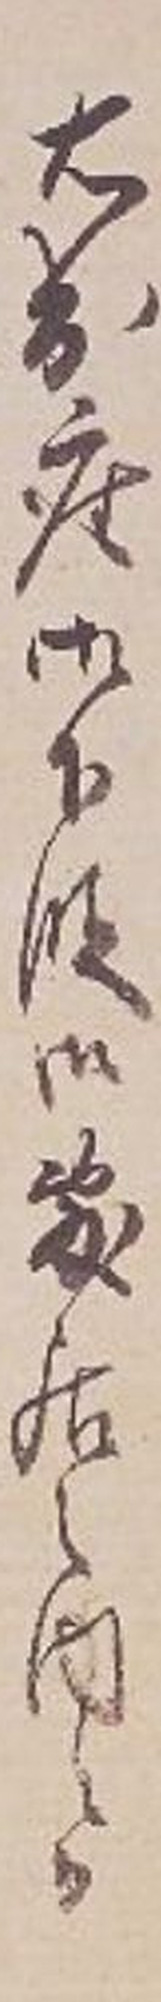右出座御下段御敷居之内にて
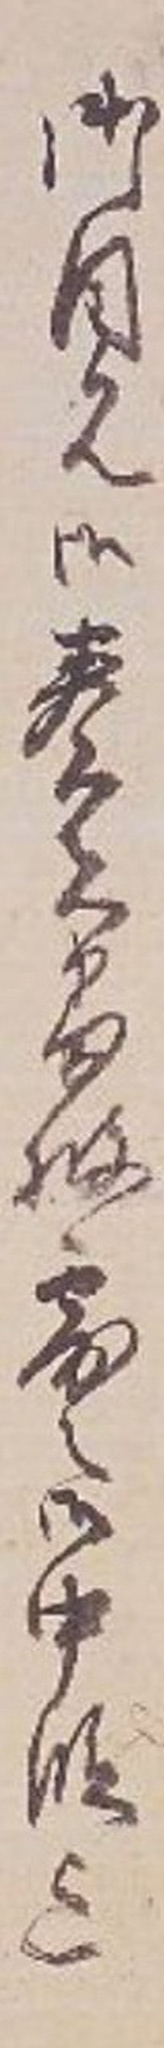御目見御奏者番披露之御中段迄
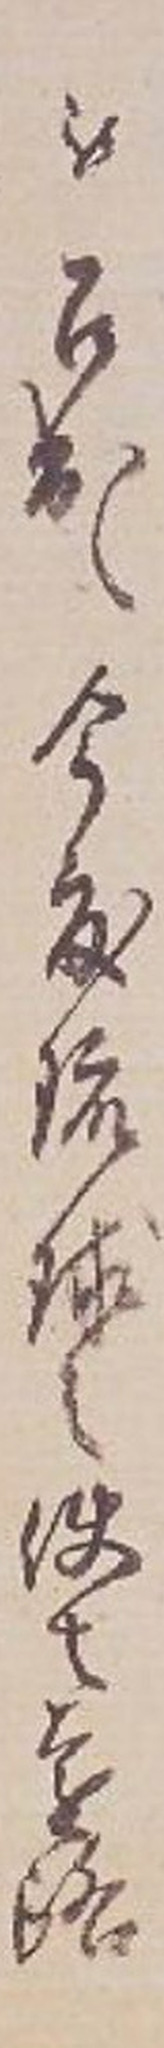被召出候今度琉球之使者遠路
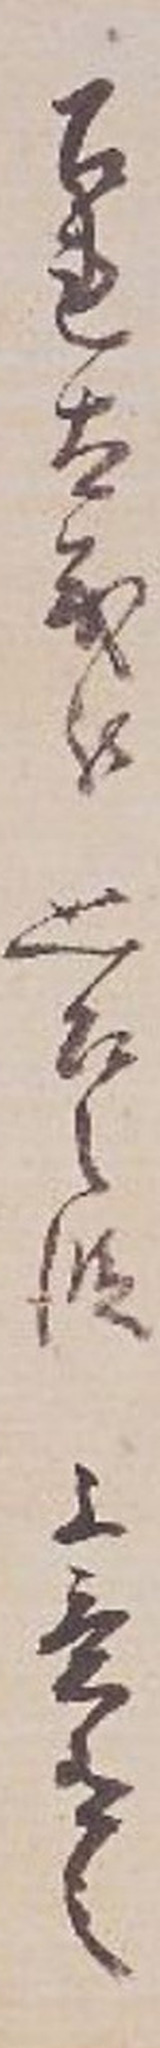召連大義被思召候段上意有之
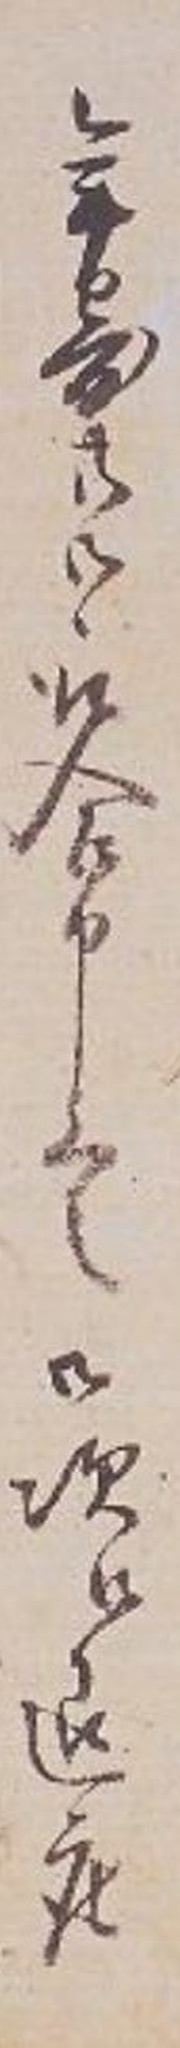年寄共御取合申上候御次え退座
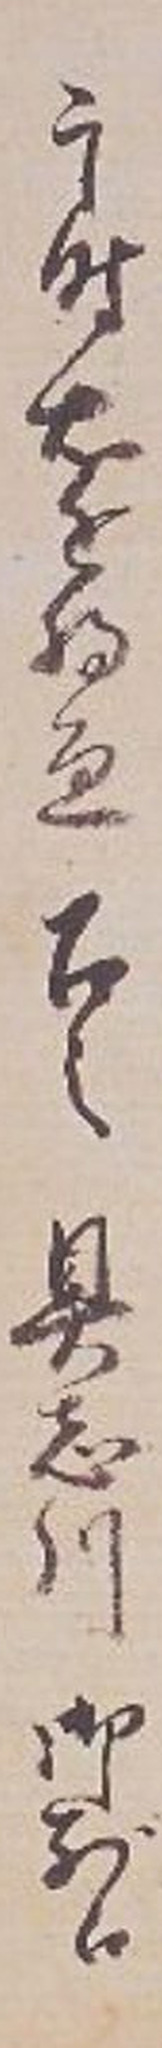于時右近将監右之具志川御前え

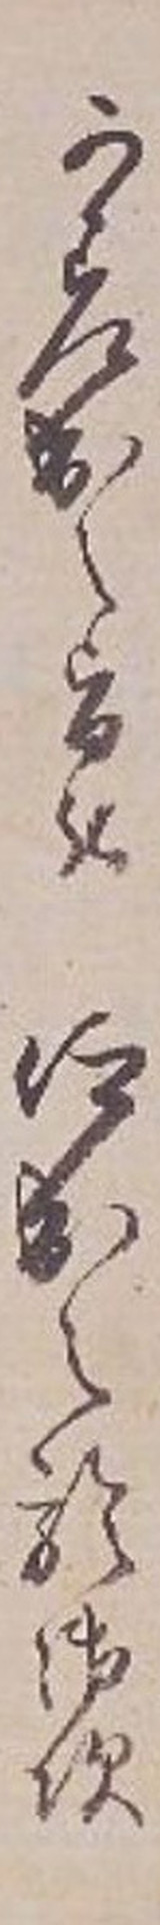可差出之旨被仰出之於御次
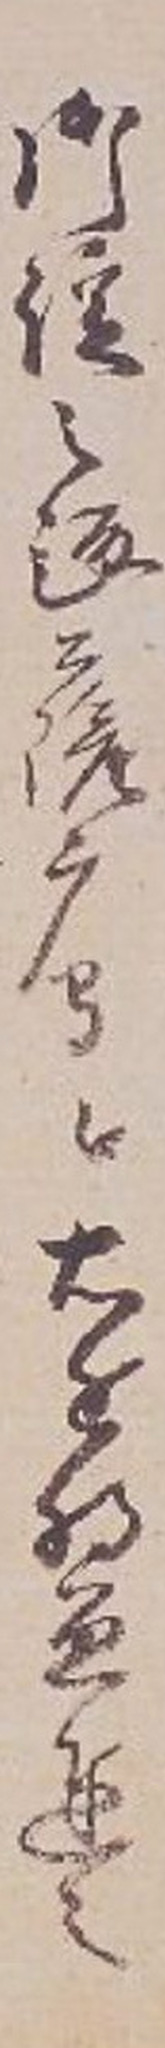御諚之趣薩摩守え右近将監達也
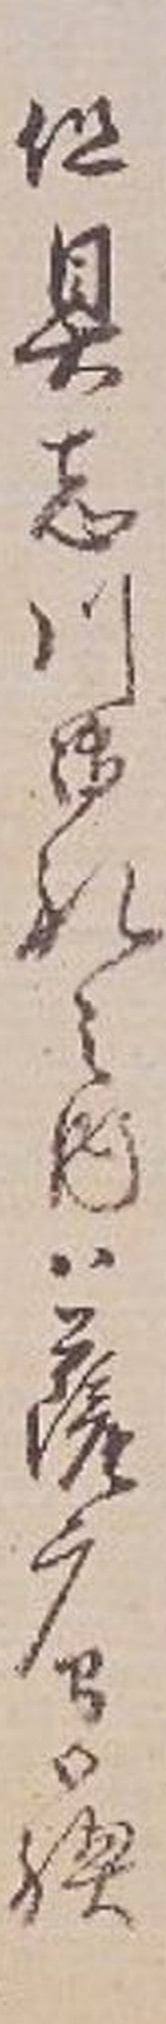但具志川御礼之内は薩摩守御襖
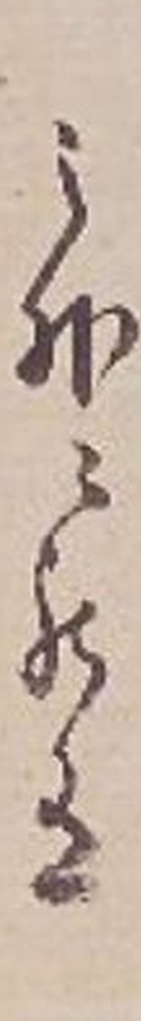之外に罷有
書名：琉球人来朝記 三、四
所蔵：University of the Ryukyus Library
